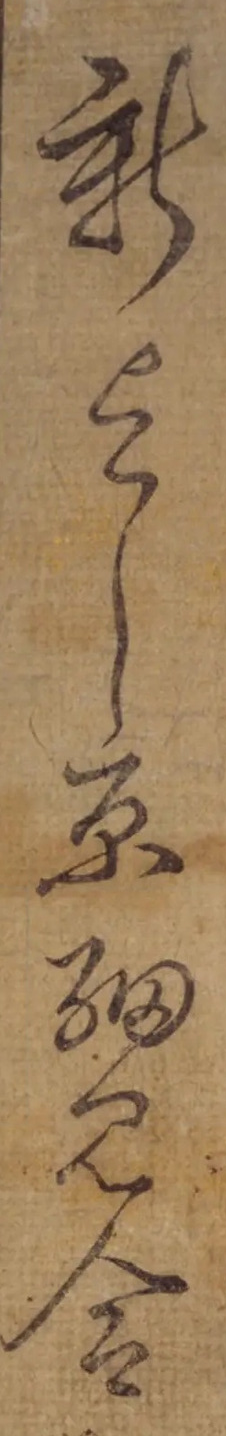新よし原細見合上

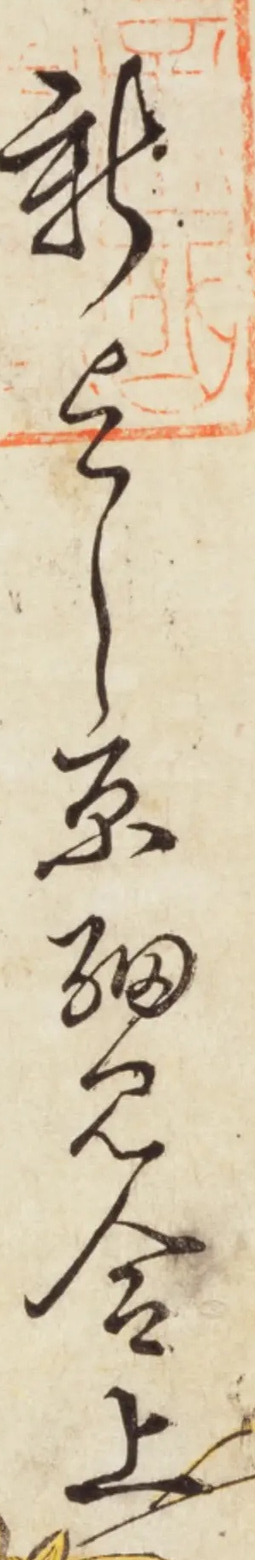新よし原細見合上

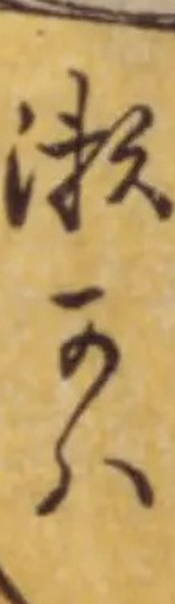瀬かは
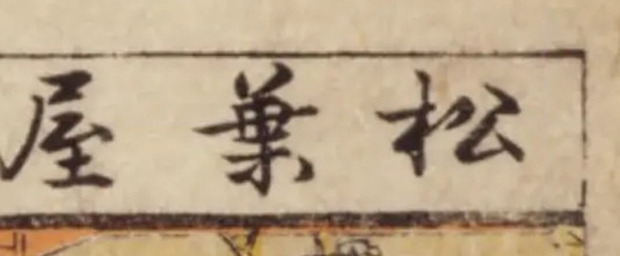松葉屋

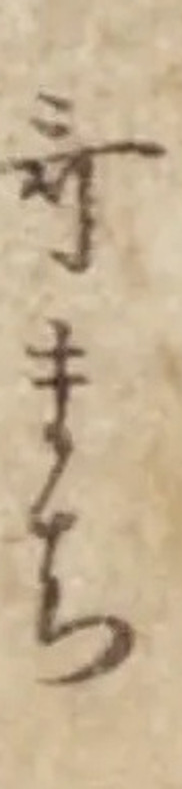哥まち
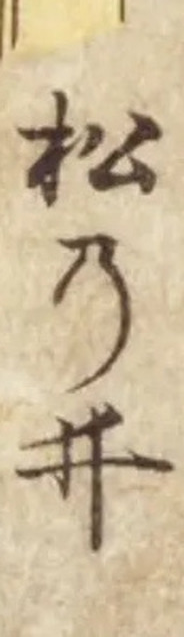松乃井
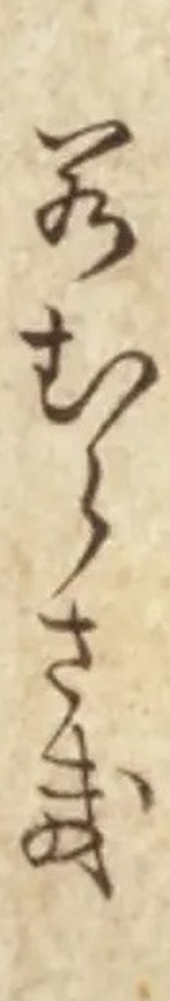若むらさき
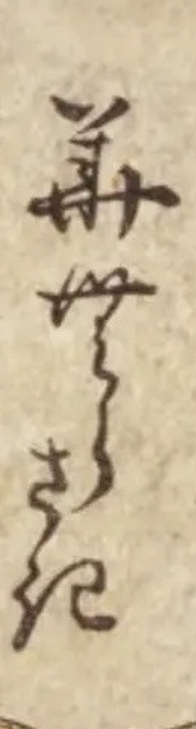華むらさき

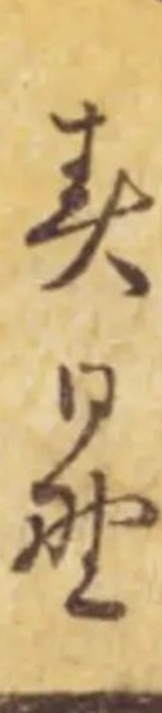春日野
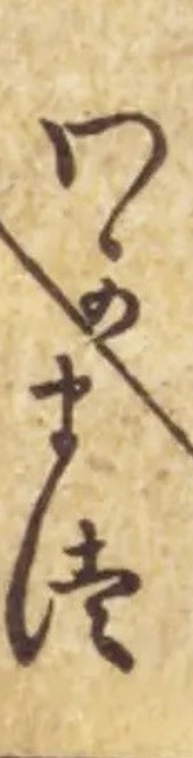わかまつ
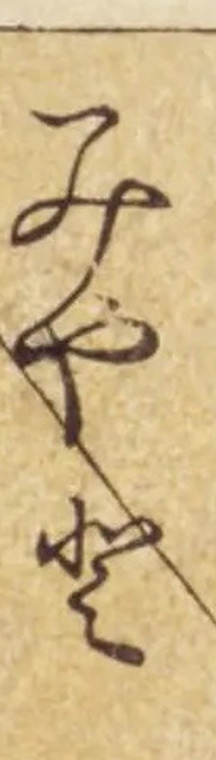みやと

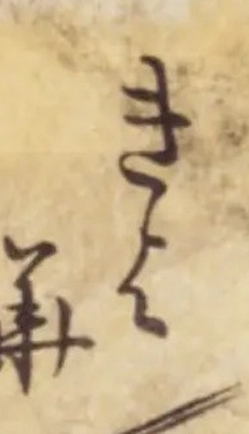きよ華
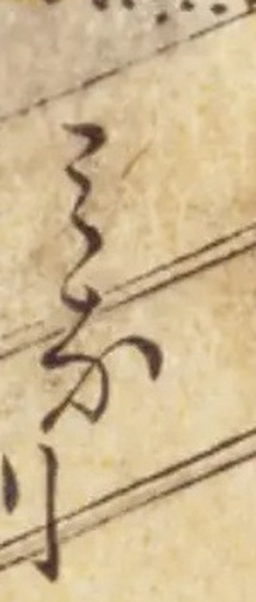みな川
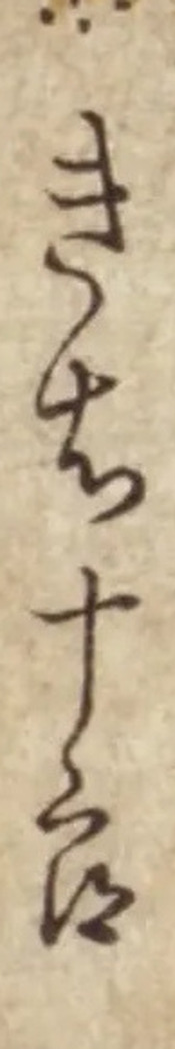きち十郎

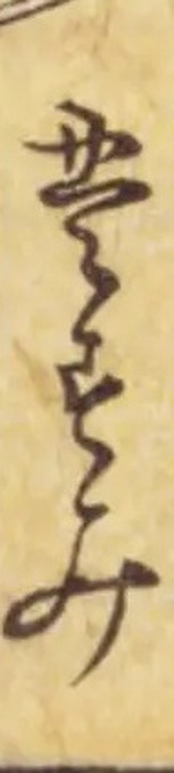豊すみ
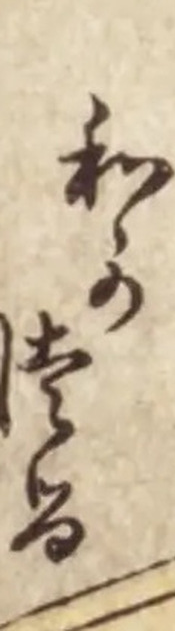わかつる
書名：青楼美人合姿鏡. 上
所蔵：国立国会図書館 National Diet Library, JAPAN
